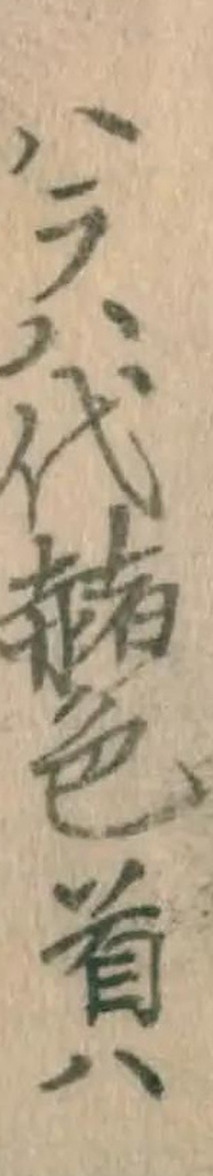ハラハ代赭色首ハ
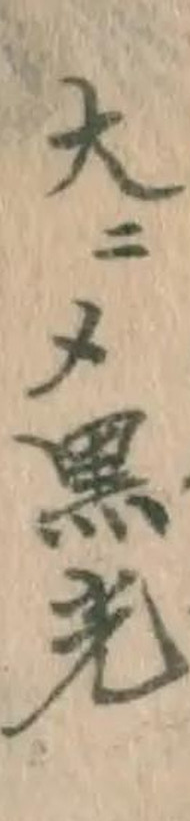大ニシテ黒光
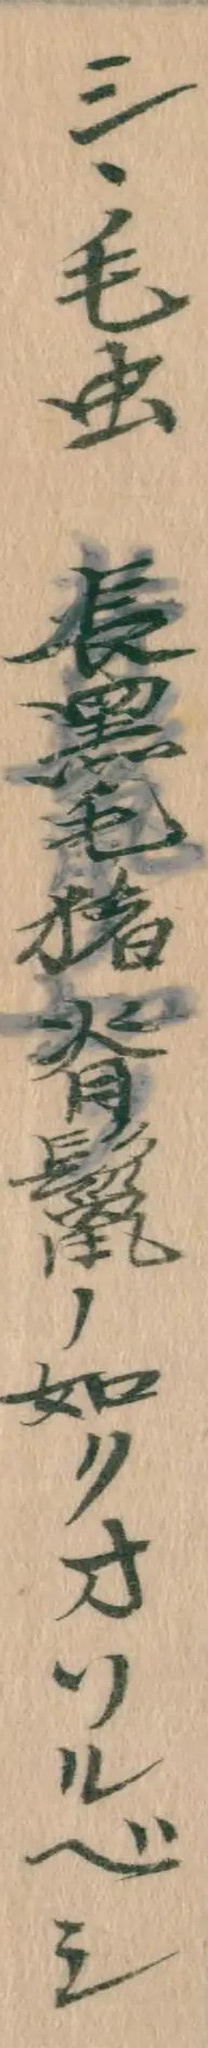シヽ毛虫長黑毛猪脊鬣ノ如クオソルベシ

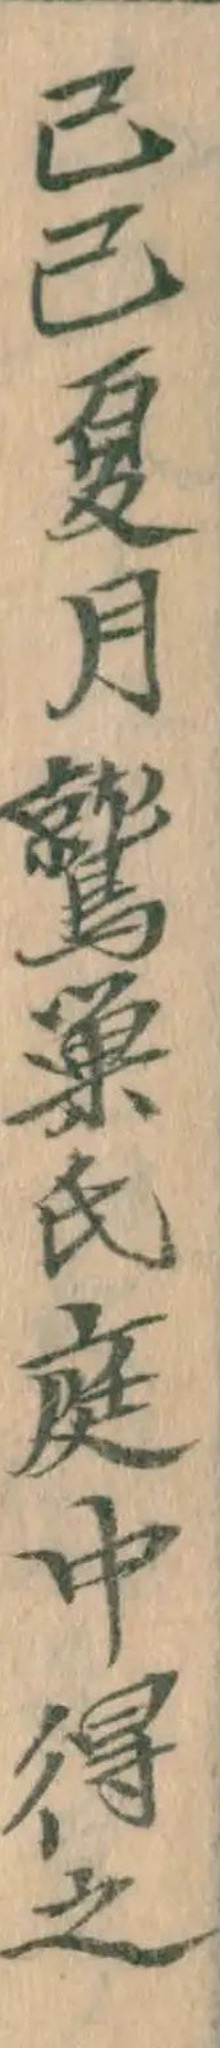己巳夏月鷲巣氏庭中得之
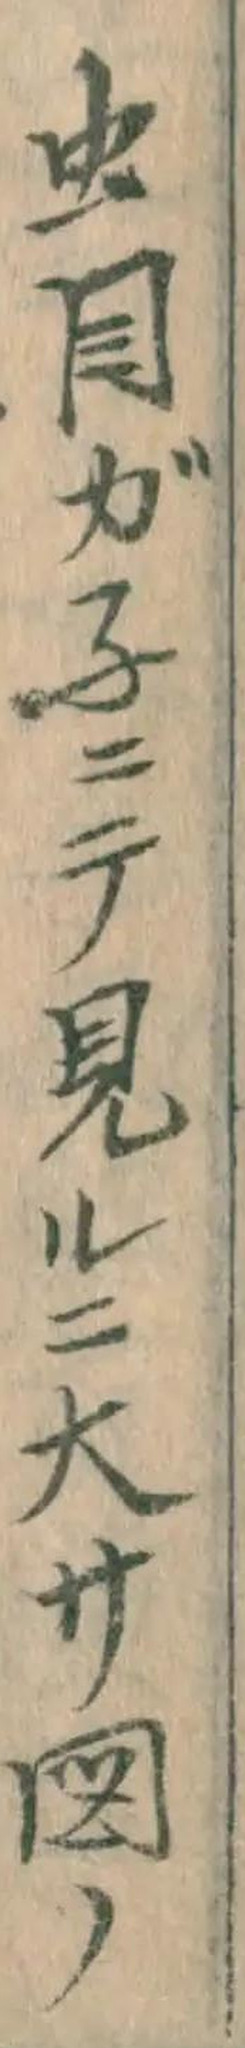虫目ガネニテ見ルニ大サ図ノ
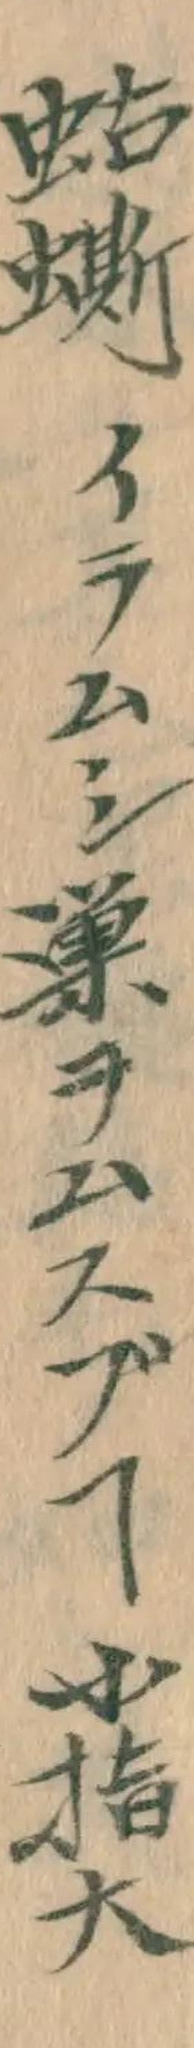蛅蟖イラムシ巣ヲムスブコト小指大
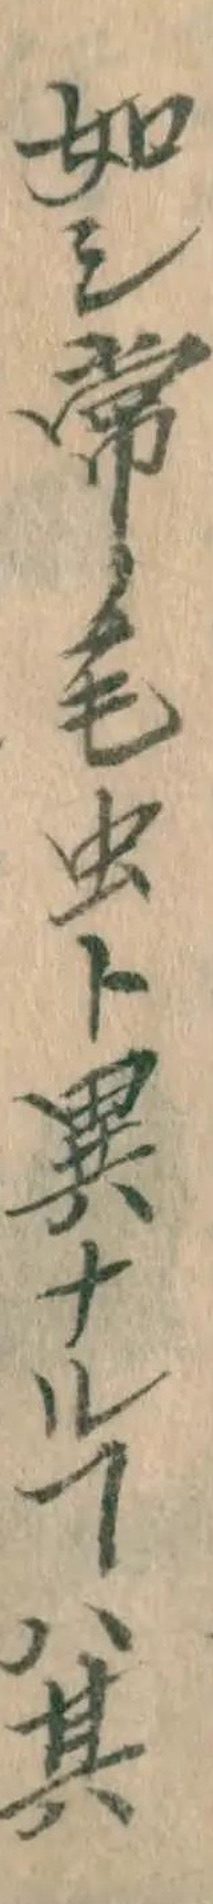如シ常ノ毛虫ト異ナルコトハ其
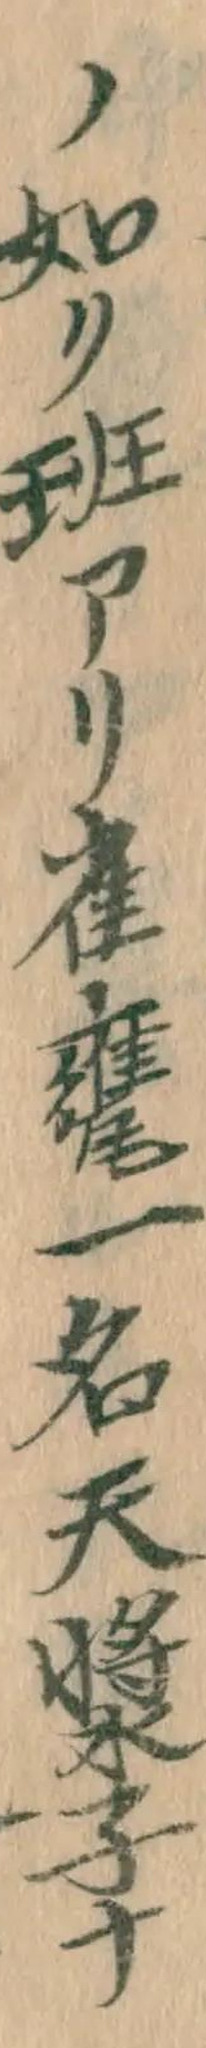ノ如ク班アリ雀甕一名天漿子ナ
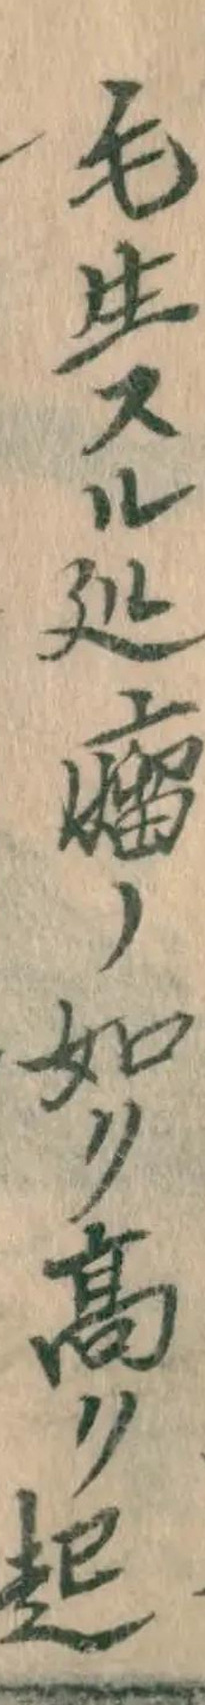毛生スル処瘤ノ如ク高ク起
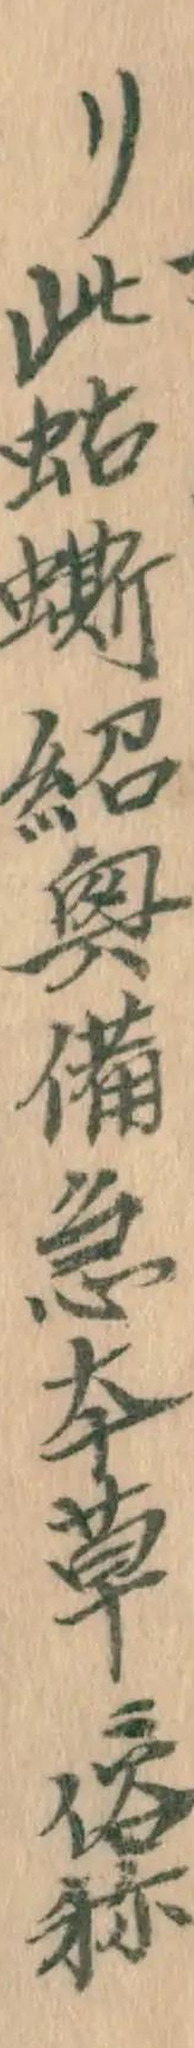リ此蛅蟖紹興備急本草ニ俗称
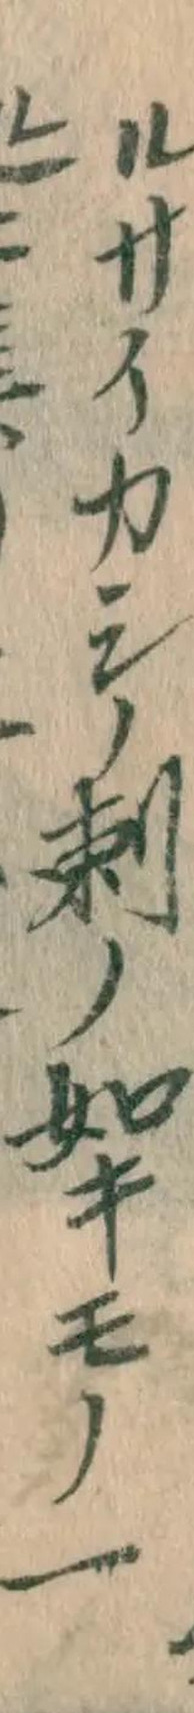ルサイカシノ刺ノ如キモノ一
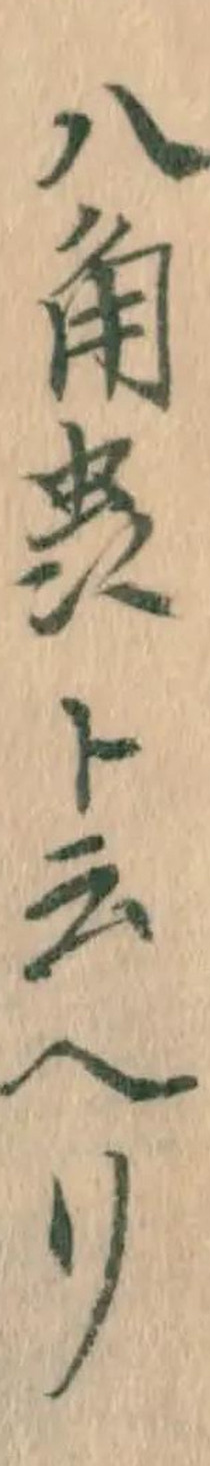八角蟲ト云ヘリ
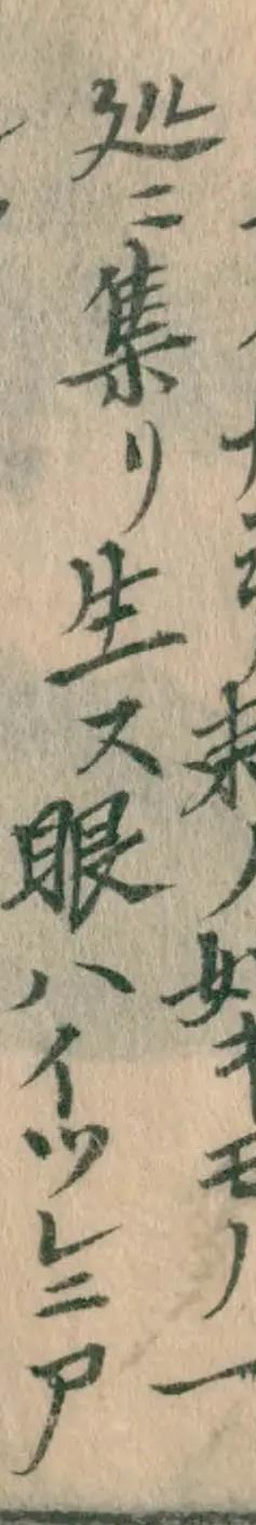処ニ集リ生ス眼ハイツレニア
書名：千蟲譜 3巻. [1]
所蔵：国立国会図書館 National Diet Library, JAPAN
